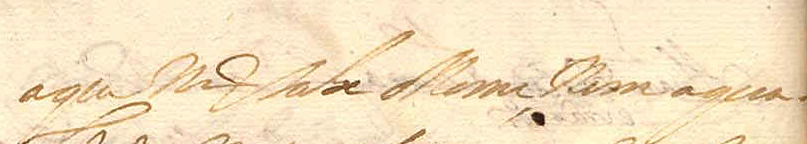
a que naõ sabe o Nome, Nem a qua
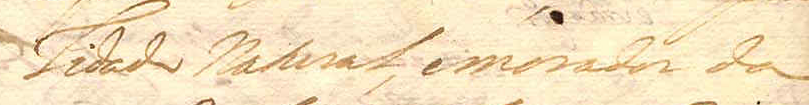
Lidade natural, e morador da
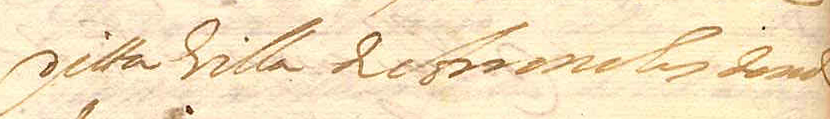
ditta Villa de Arronches donde
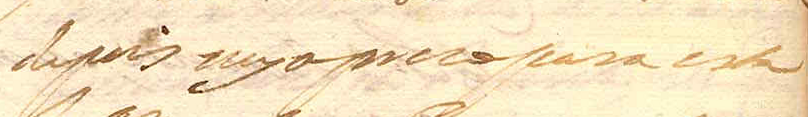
depois ueyo prezo para esta
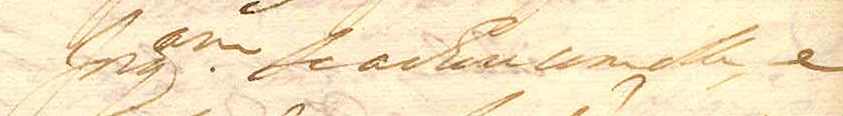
Jnq.am se achou com elle e
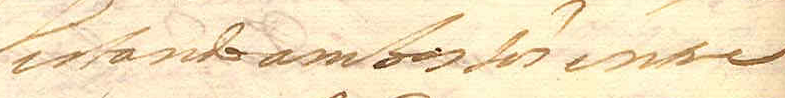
estando ambos sós entre
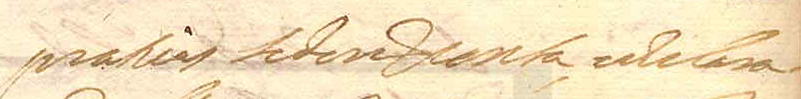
praticas se derão conta, e declara
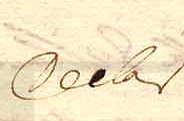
Declar
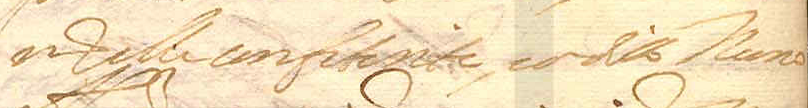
raõ elle confitente, e o dito Nuno
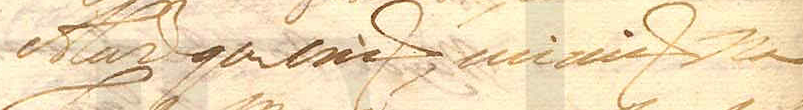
Aluz̄ que criaõ, uiuiaõ na
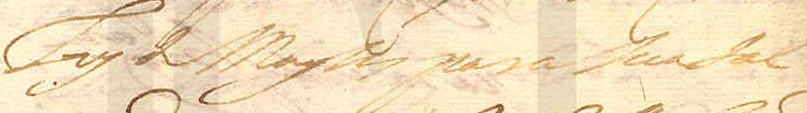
Ley de Moyzes para sua sal
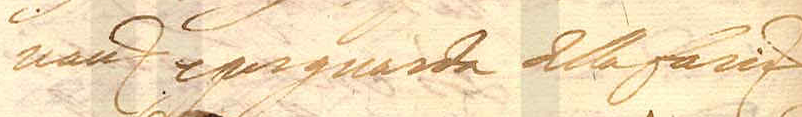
uacaõ e por guarda della faziaõ
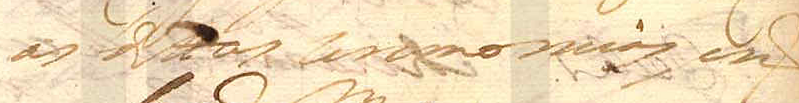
as dittas ceremonias e naõ
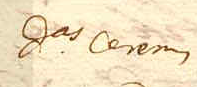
das. cerem
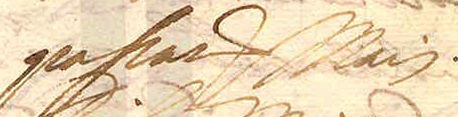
passarā Mais.
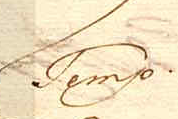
Temp.
